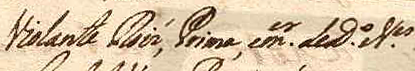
Violante Roiz̄, Prima, e m.er de D.o N.es
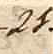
21.
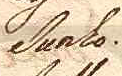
Iunho.
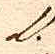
d.o
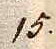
15.
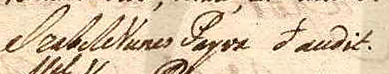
Izabel Nunes Payva d̄ audit.
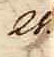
21.
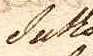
Iulho
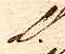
d.o
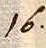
16.
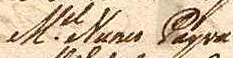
M.el Nunes Payva
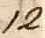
12
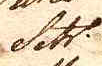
Setr.o
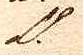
d.o
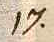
17.
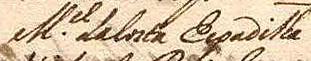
M.el da Costa Eepadilha
